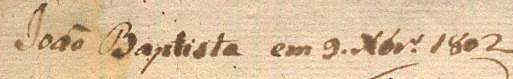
Ioaõ Baptista em 9. Nbr.o 1802
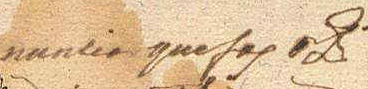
nuncia que fas o P.e
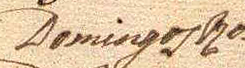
Domingos Ro
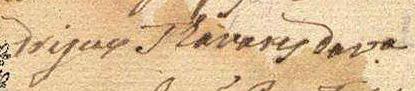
drigues Thavares da v.a
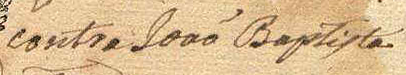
contra Ioaõ Baptista
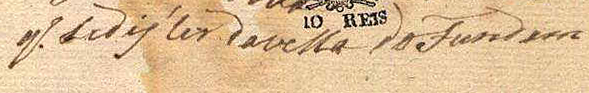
q̄ se dis ser da villa do Fundam.
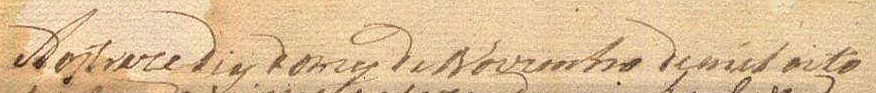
Aos treze dias do mes de Novembro de mil oito
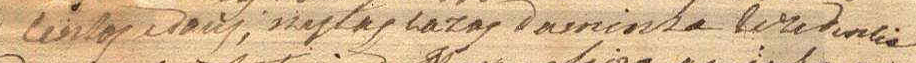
centos e dous, nestas cazas da minha rezedencia
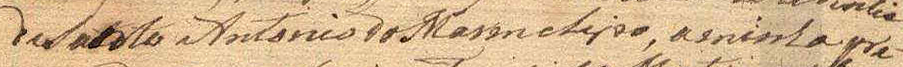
de Santo Antonio do Marmeleiro, a minha pre
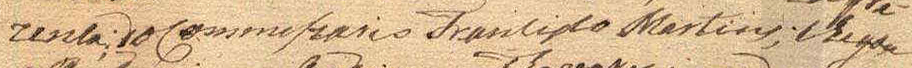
zença; do Commissario Francisco Martins; chegou
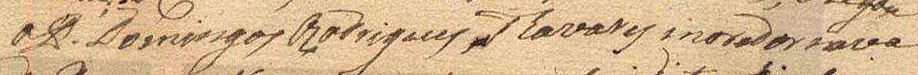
o P. Domingos Rodrigues Thavares morador na v.a
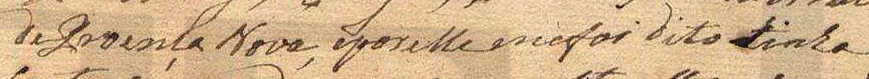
de Proença Nova, e por elle me foi dito tinha
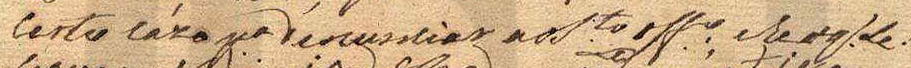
certo cazo p.a denunciar ao S.to Off.o e he o q̄ se
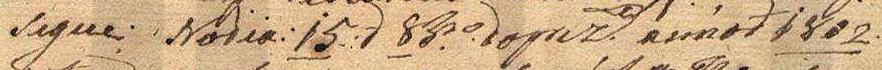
segue: No dia i5 d 8b.ro do prez.te anno d̄ i802.
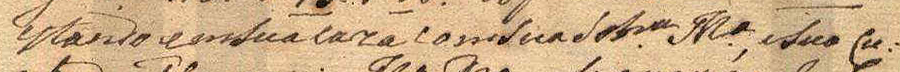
estando em sua caza com sua sobr.a M.a, e sua Cu
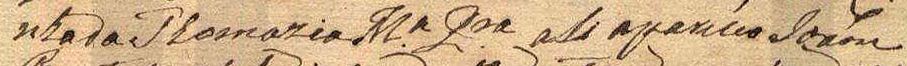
nhada Thomazia M.a P.ra, ali apareceo Ioam
